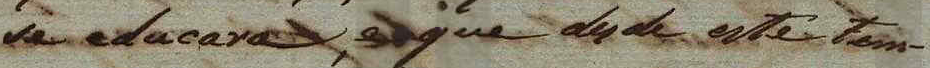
se educara, e que desde este tem
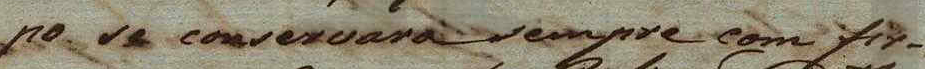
po se conservara sempre com fir
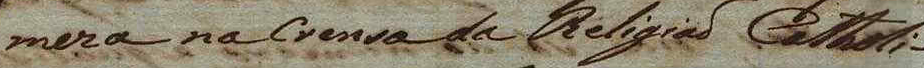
meza na crensa da Religiaõ Catholi
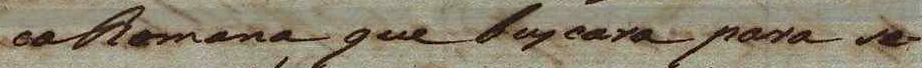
ca Romana, que buscara para se
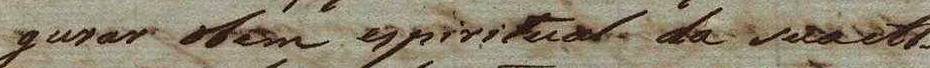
gurar o bem espiritual da sua Al
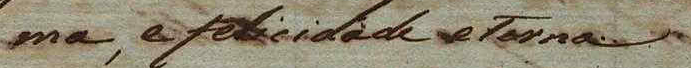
ma, e felicidade eterna.
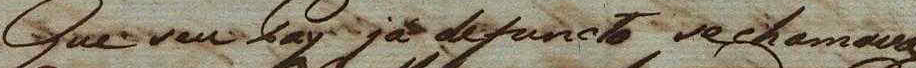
Que seu Pay já defuncto se chamava
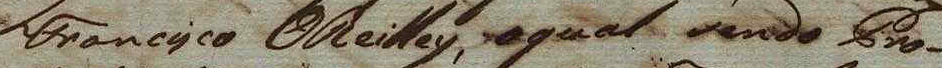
Francisco OReilley, o qual sendo Pro
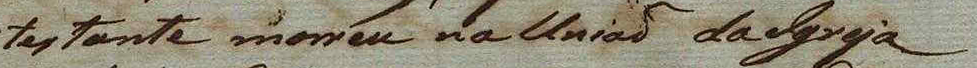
testante morreu na Uniaõ da Igreja
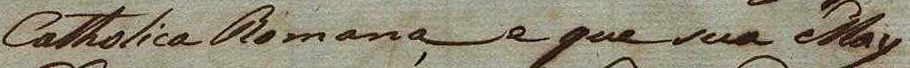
Catholica Romana, e que sua May
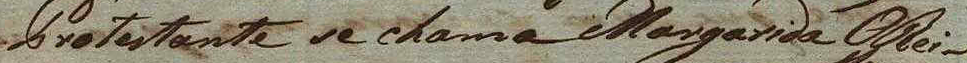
Protestante se chama Margarida ORei
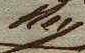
lley
